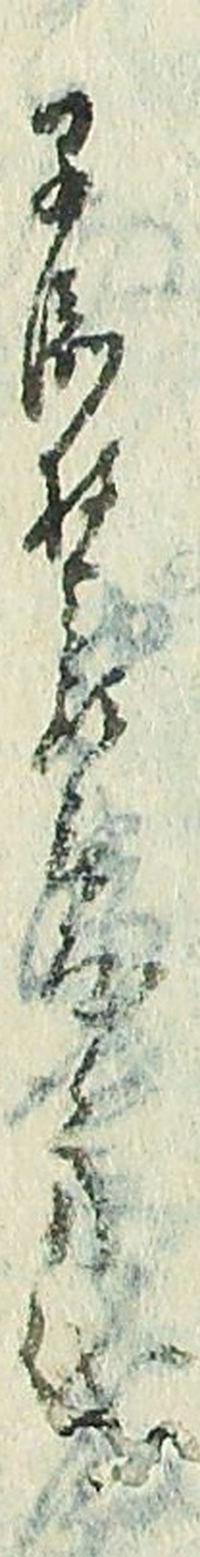早渕村与頭庄屋御用代
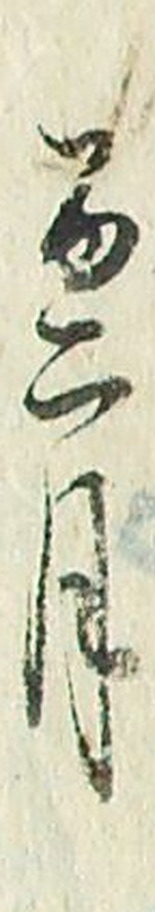酉二月
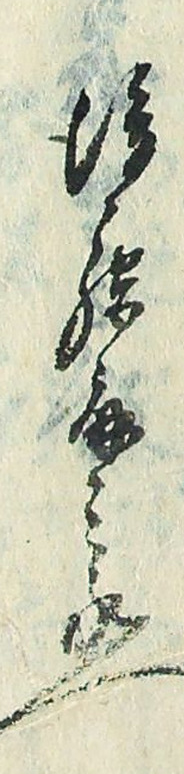後藤麻之丞

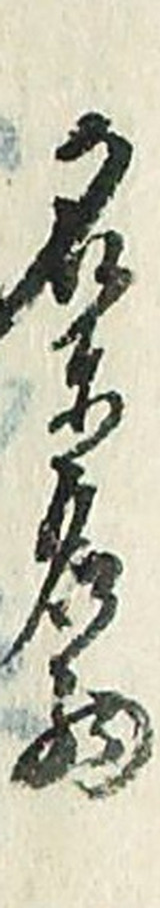名東名西
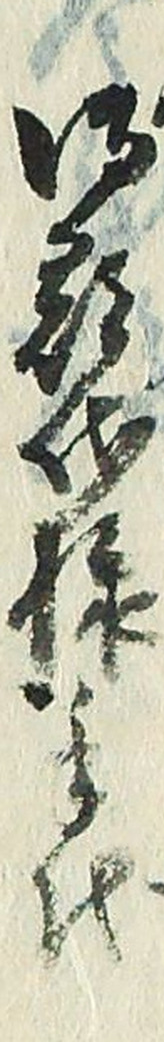御郡代様御手代
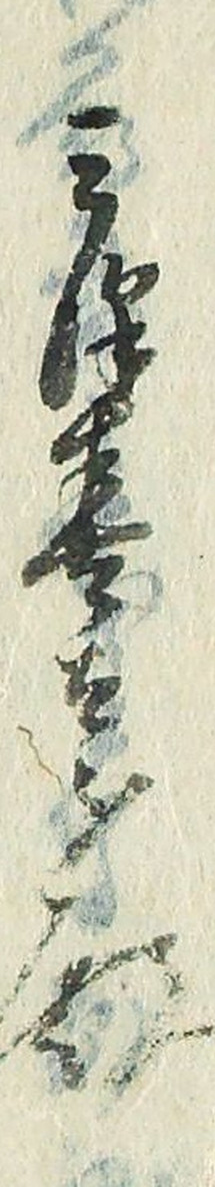三沢春太郎殿
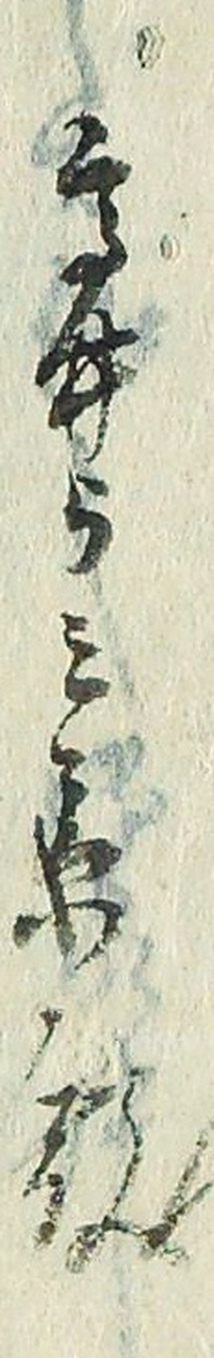高井与三兵衛殿
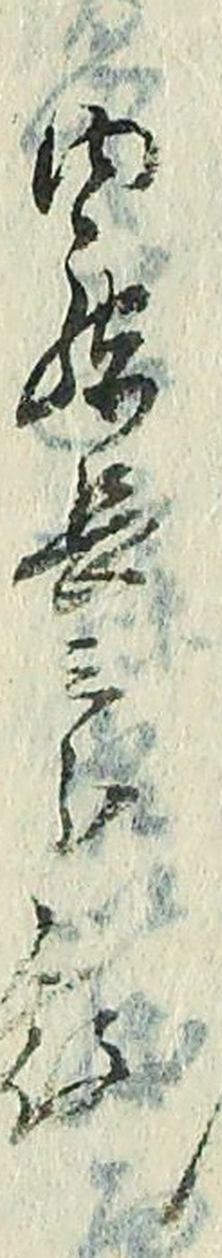内藤長三郎殿
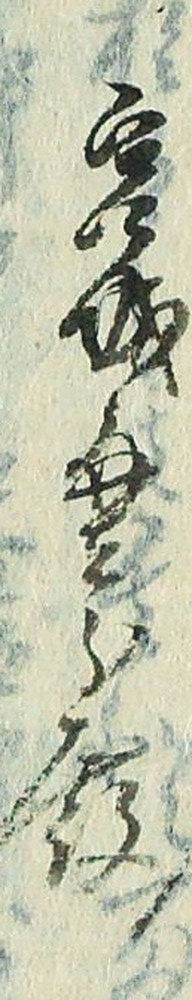宮城麻太郎殿
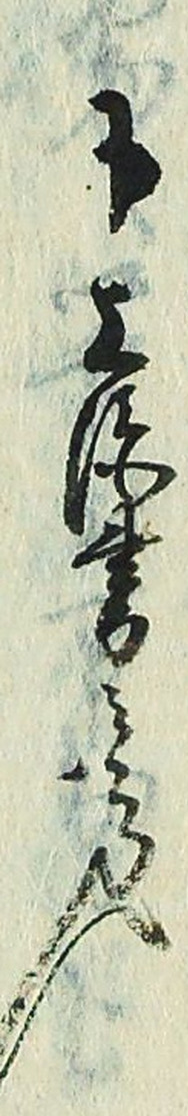申上添書之覚
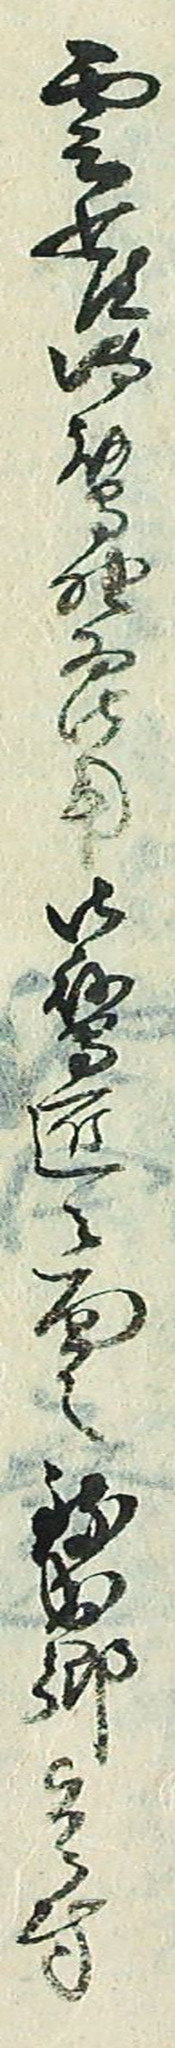雲雀御鷹野為御用御鷹匠之面々致出郷候に付
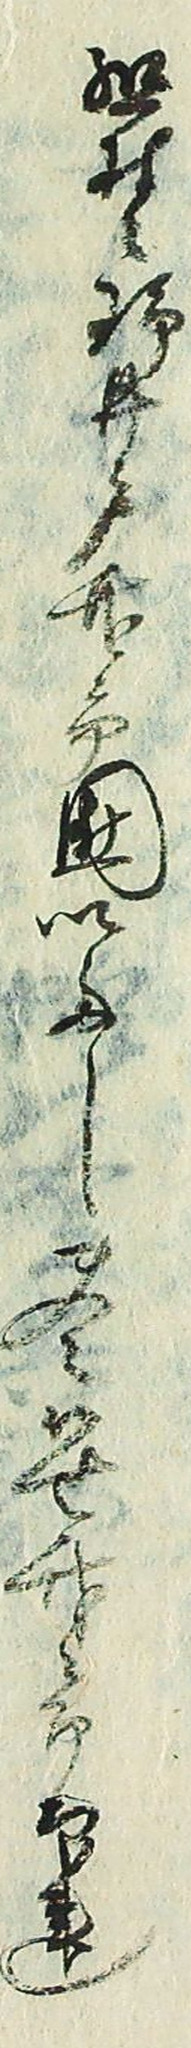組村々野井戸竹に而囲いたし夫々笹竹に而印建
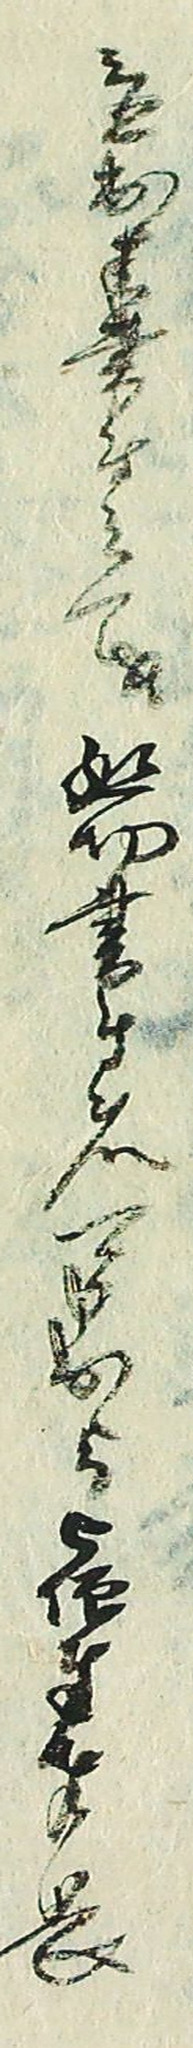置出来書付之義組切書付を以可申出旨被仰付奉畏
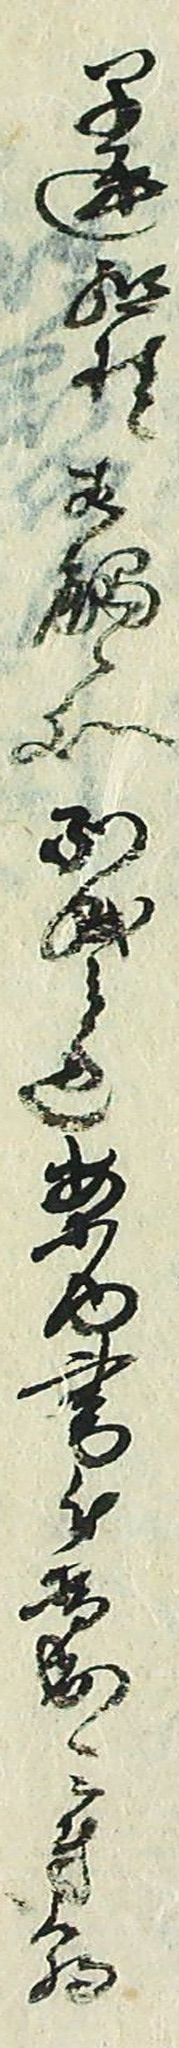早速組村々相触候処別紙之通案内書被指出候に付触
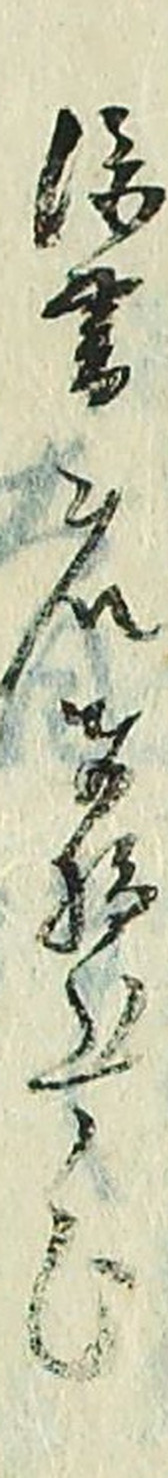添書を以奉指上候以上
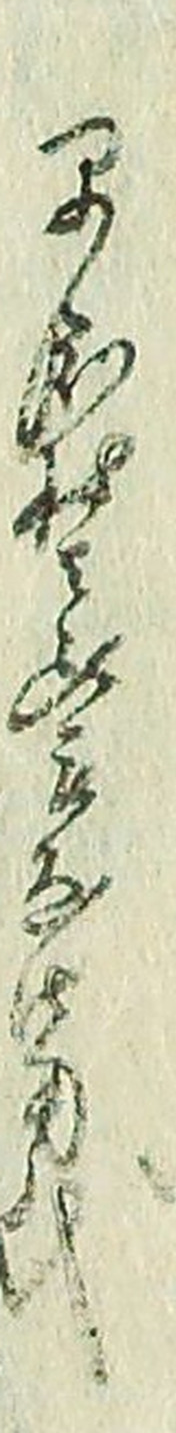早渕村与頭庄屋御用代
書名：諸御用御□受書控
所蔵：鳴門教育大学 Naruto University of Education
